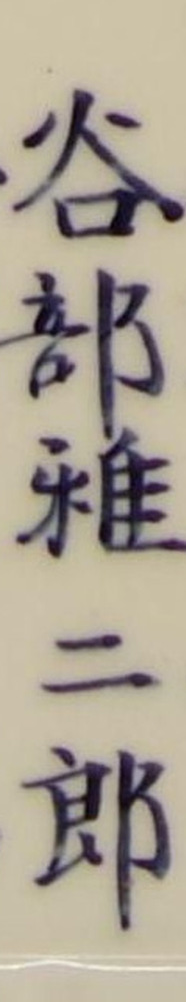谷部雅二郎
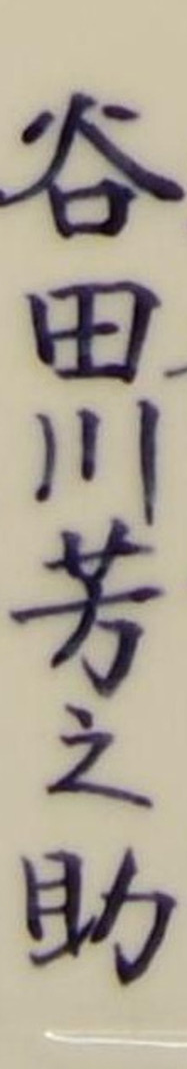谷田川芳之助
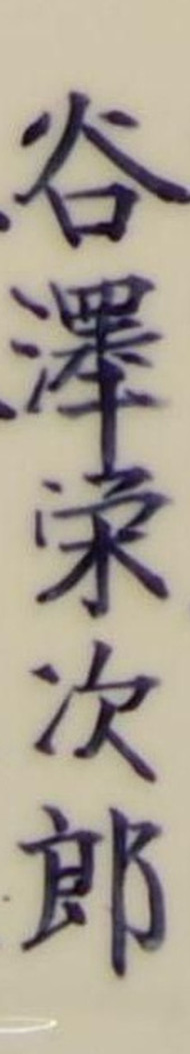谷澤栄次郎
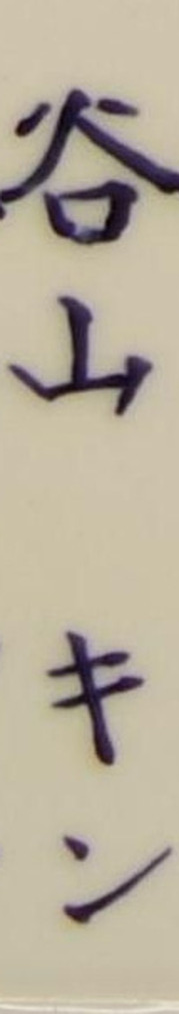谷山キン
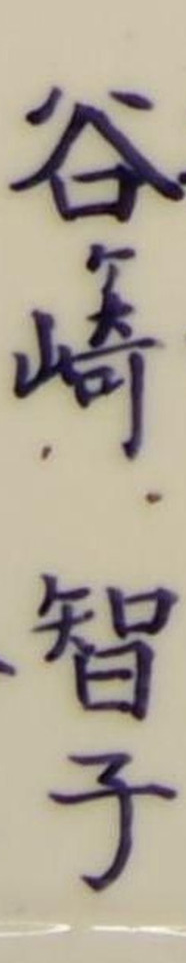谷ヶ崎智子
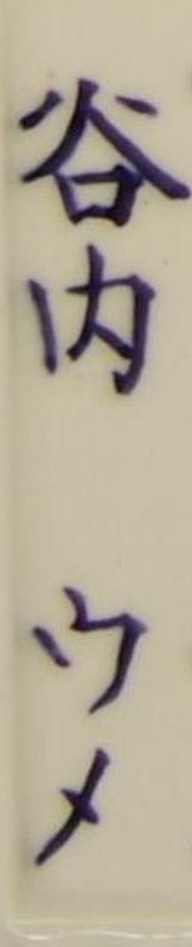谷内ウメ

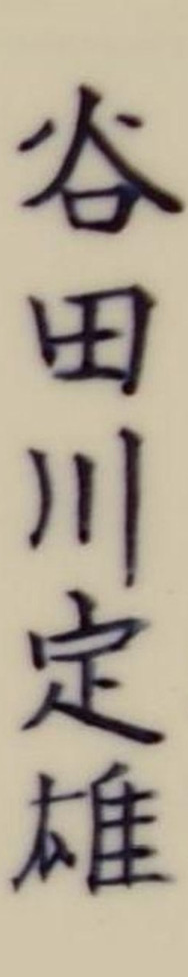谷田川定雄
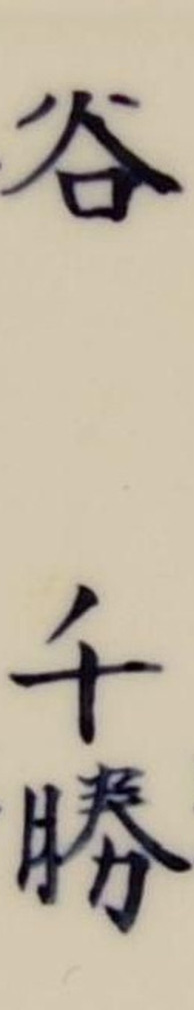谷千勝
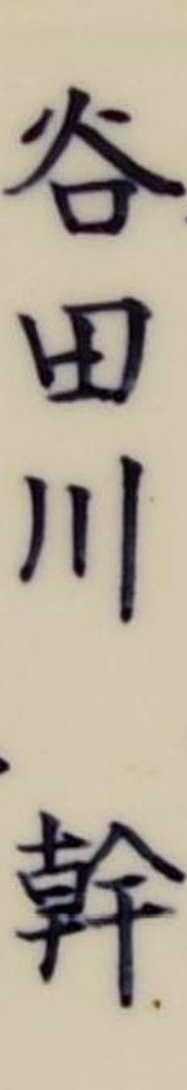谷田川幹
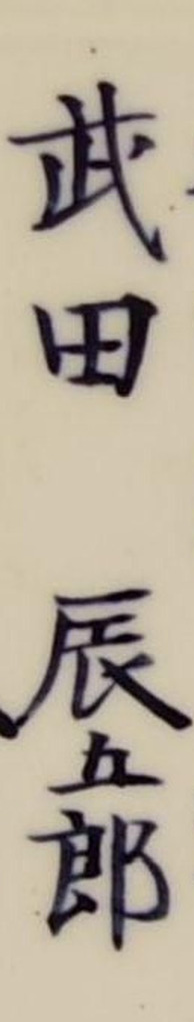武田辰五郎
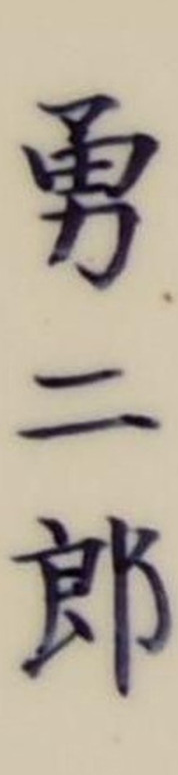勇二郎
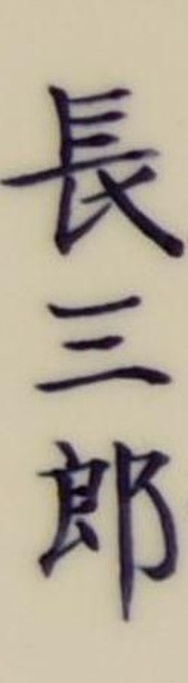長三郎
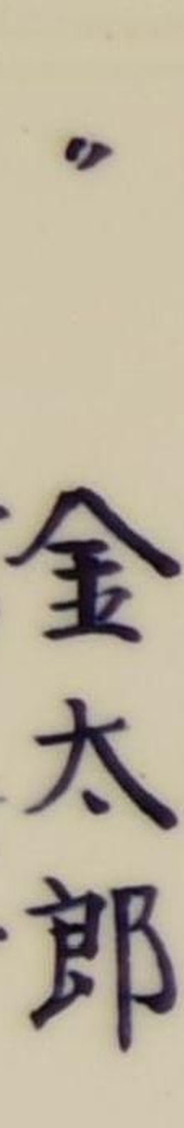金太郎
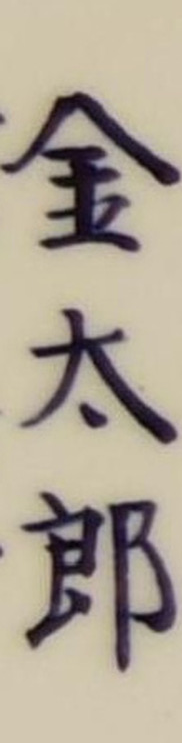金太郎
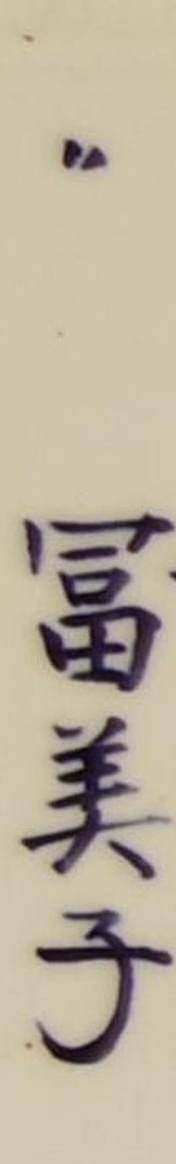冨美子
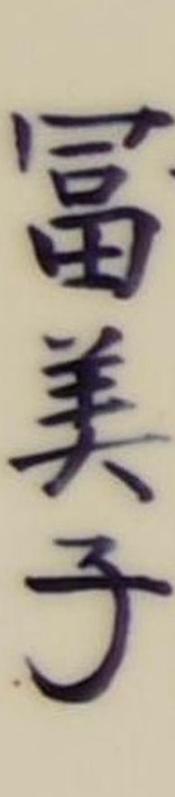冨美子
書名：A~D
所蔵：koyasan kongobuji
